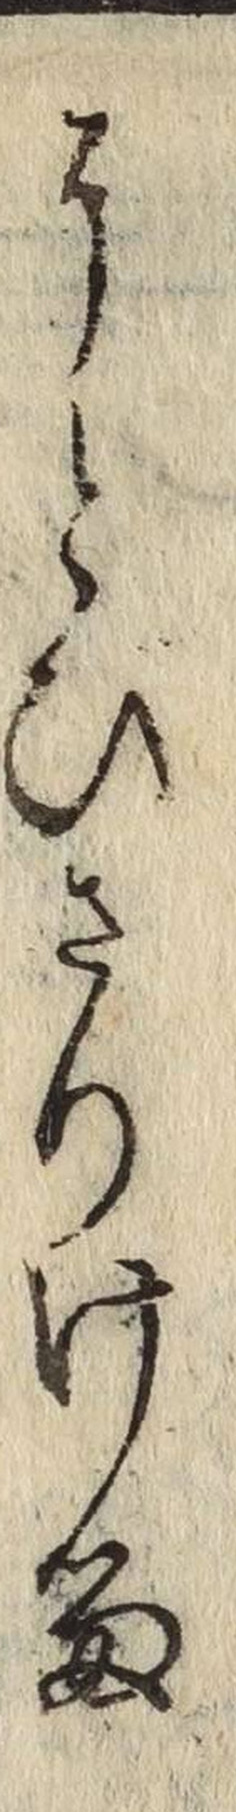にとひさりける

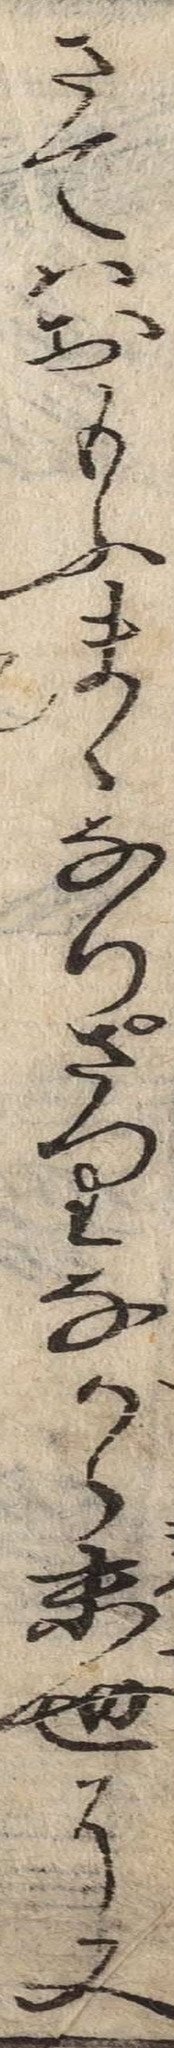さておもふまゝなり。さりながら末世に又
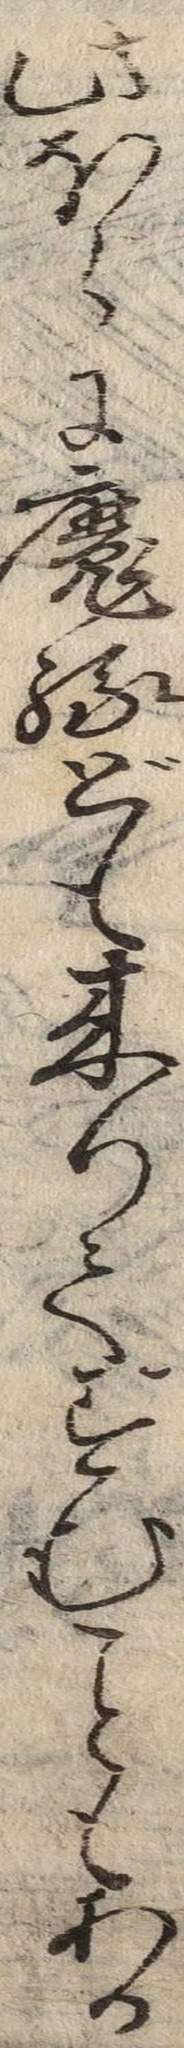此ほらに魔縁ども来りて。すむこともある
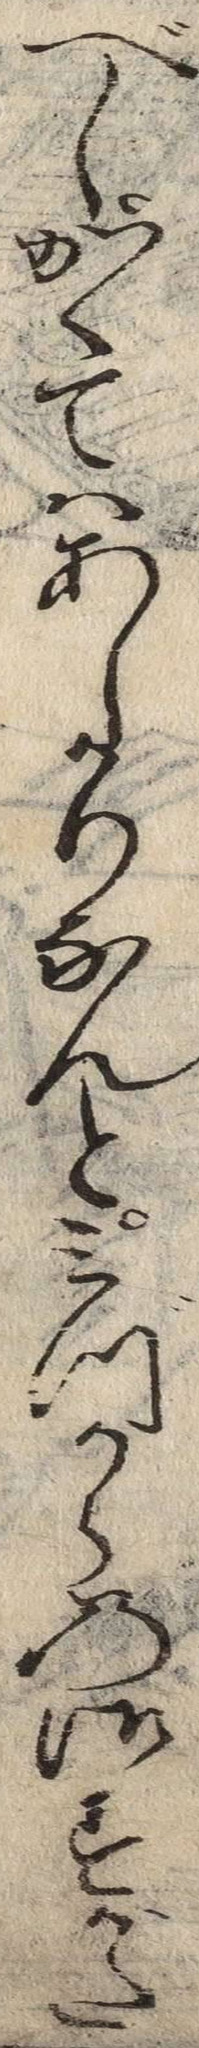べし。かくてはあしかりなんと。みづからの御すがた
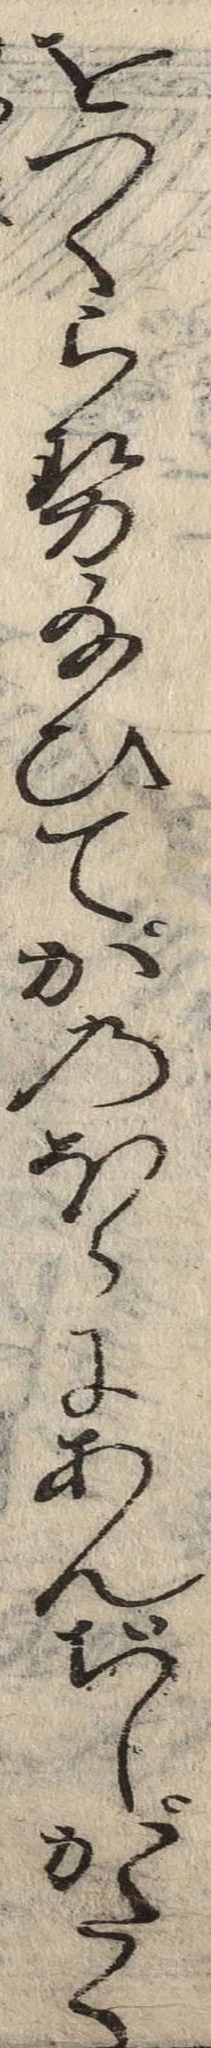をつくらせ給ひて。かのほらにあんぢし。かたく
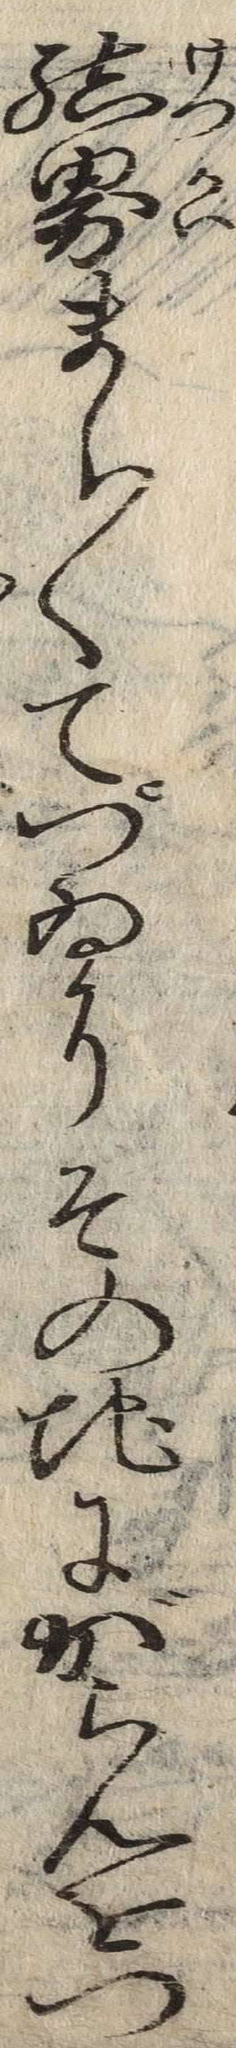結界まし〳〵て。つゐにその地にがらんをつ
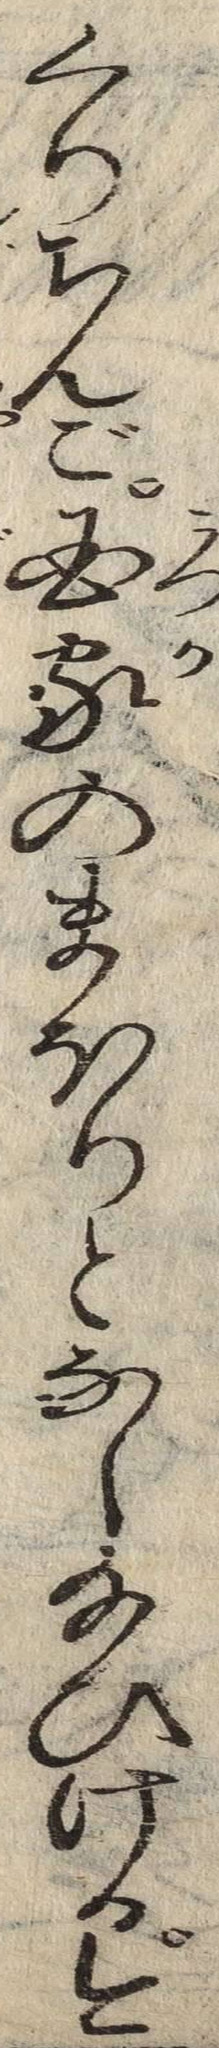くりちんご。国家のまほりとなし給ひける。今
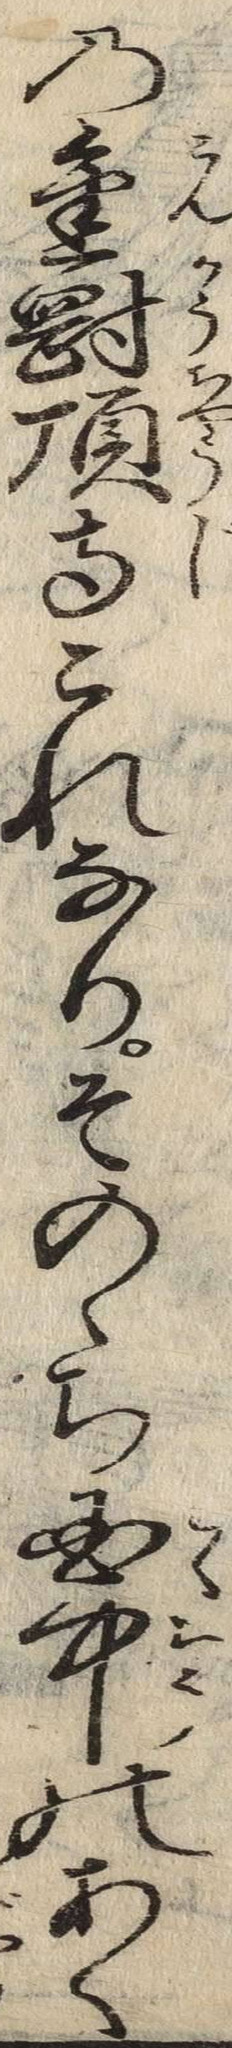の金剛頂寺これなり。そのゝち国中のあく
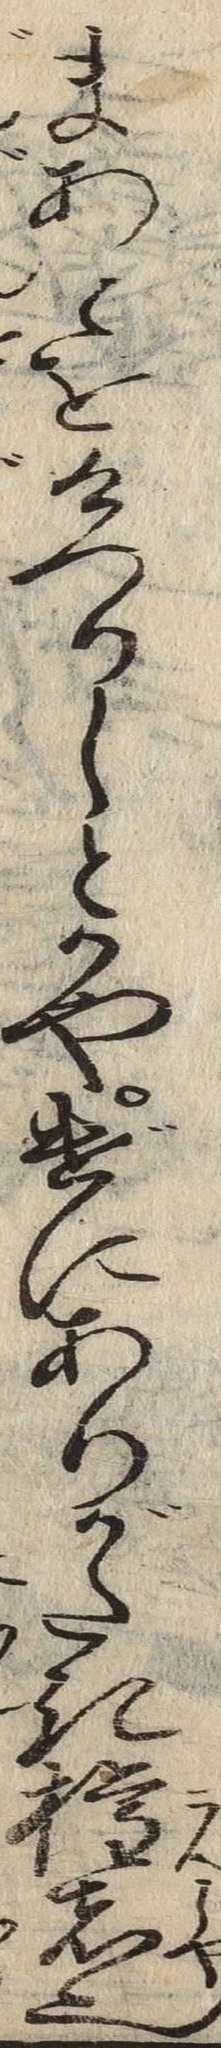まあをけつりしとかや。けにありがたき権者也
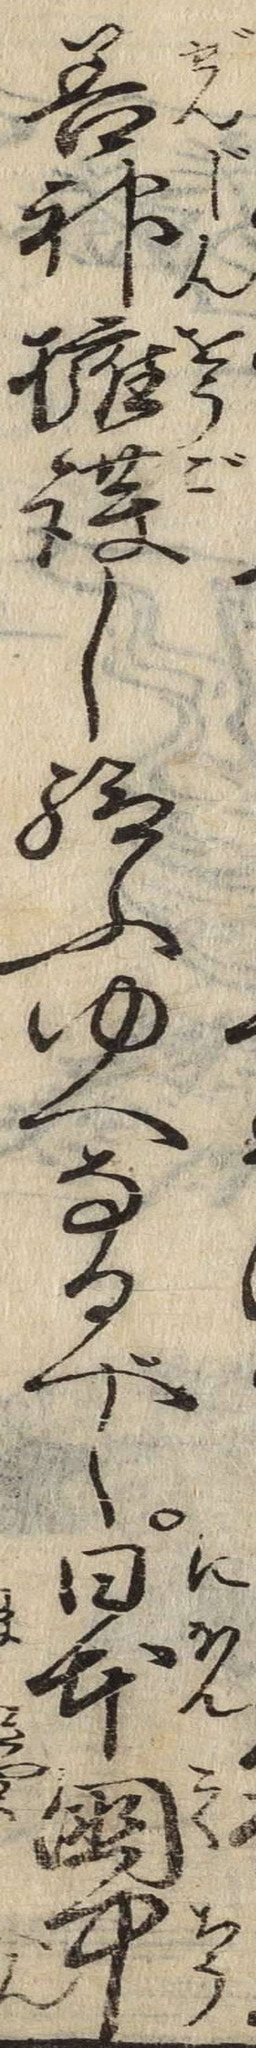善神擁護し給ふゆへなるべし。日本国中
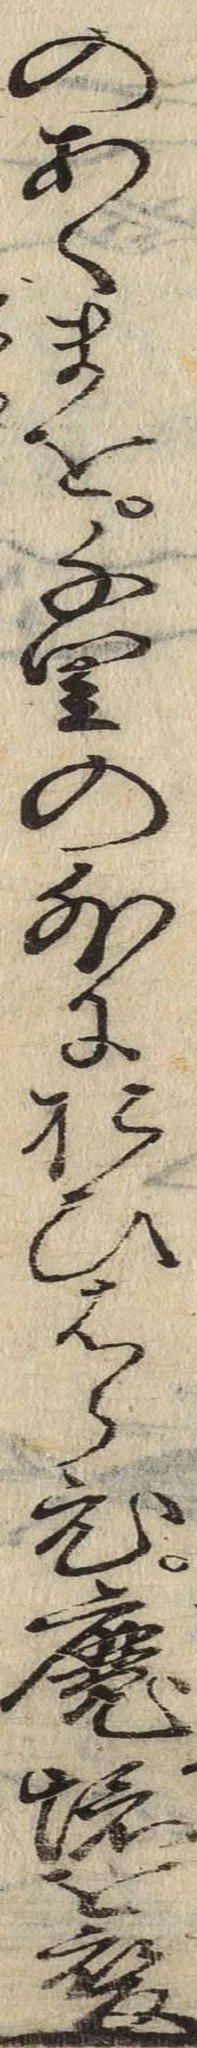のあくまを。千里の外におひはらひ。魔境を変
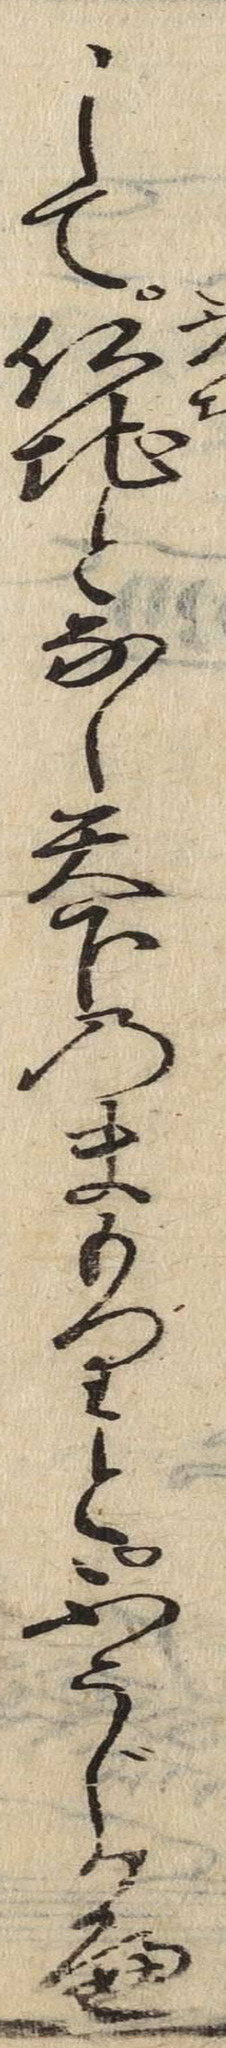して仏地となし天下のまもりと。ふうじかへ
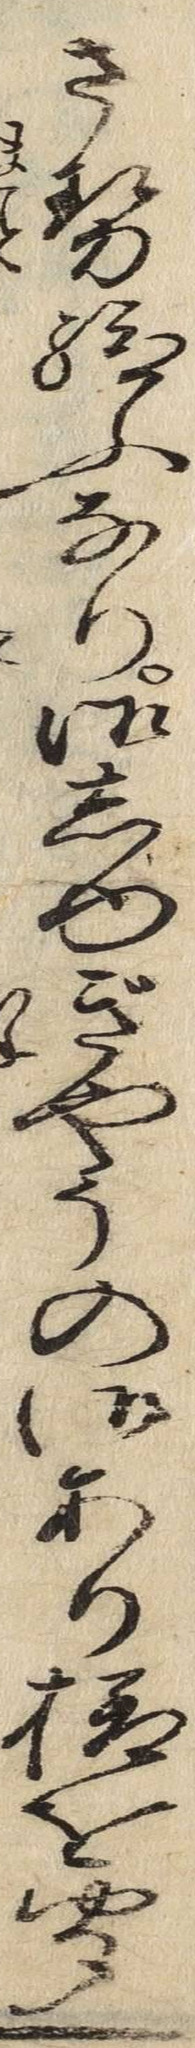させ給ふなり。御しゆぎやうの御あり様を聞
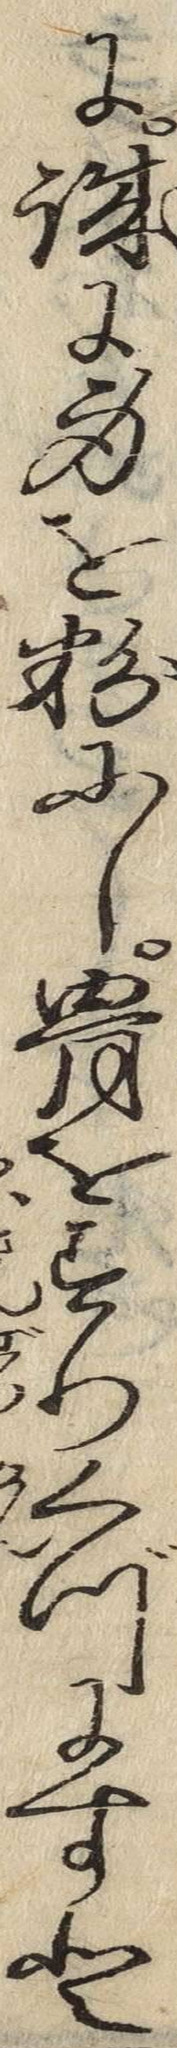に。誠に身を粉にし。骨をすりくづにすと
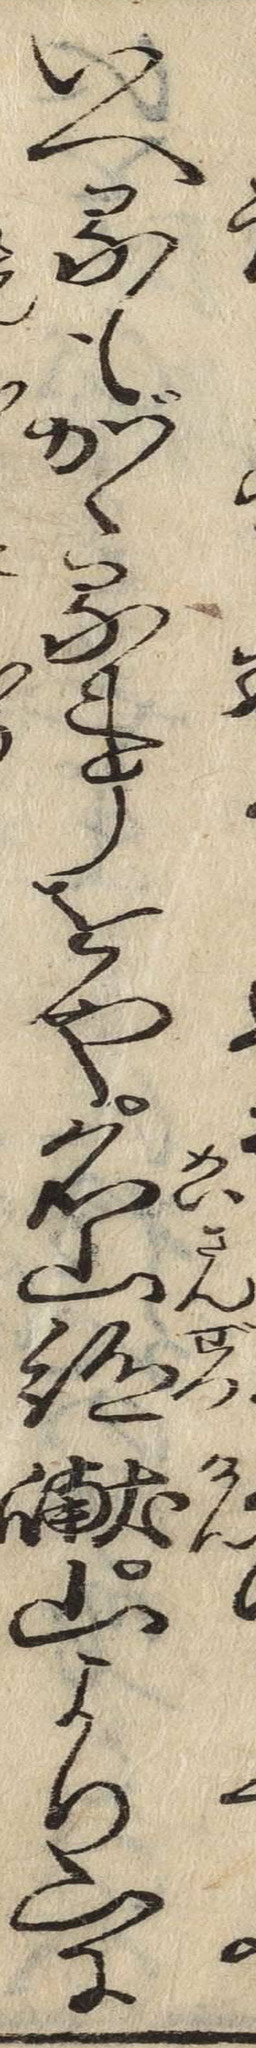いへるも。かゝる事をや。名山絶巘。山より山に
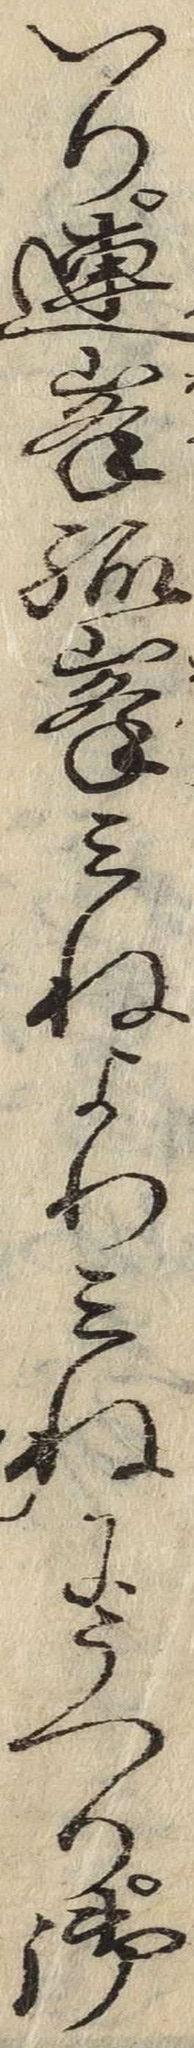いり。連峯孤峯みねよりみねにうつり。御
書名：弘法大師御傳記
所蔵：京都府立京都学・歴彩館 国文学研究資料館
